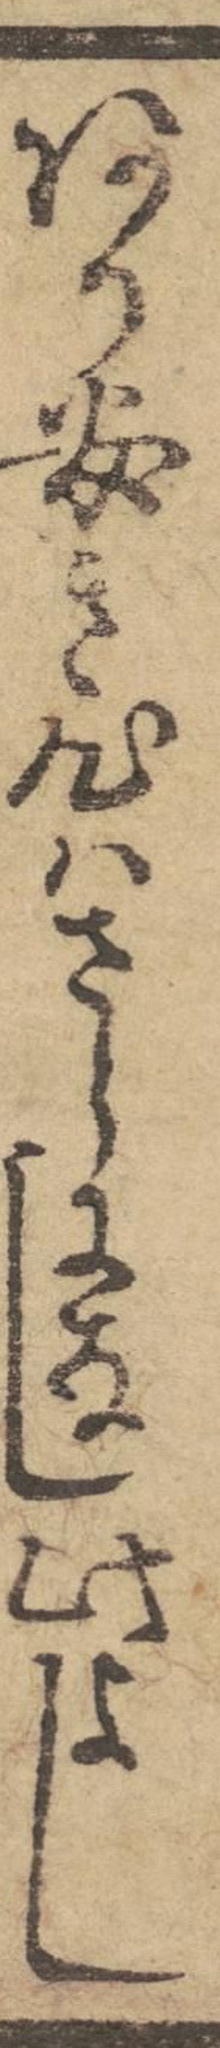あり安き心ハさらになし此よし
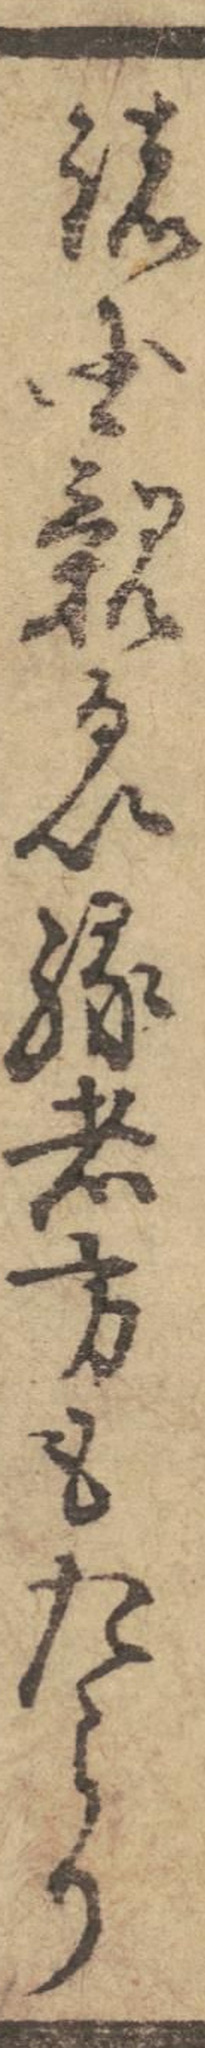諸国親るい縁者方もたより
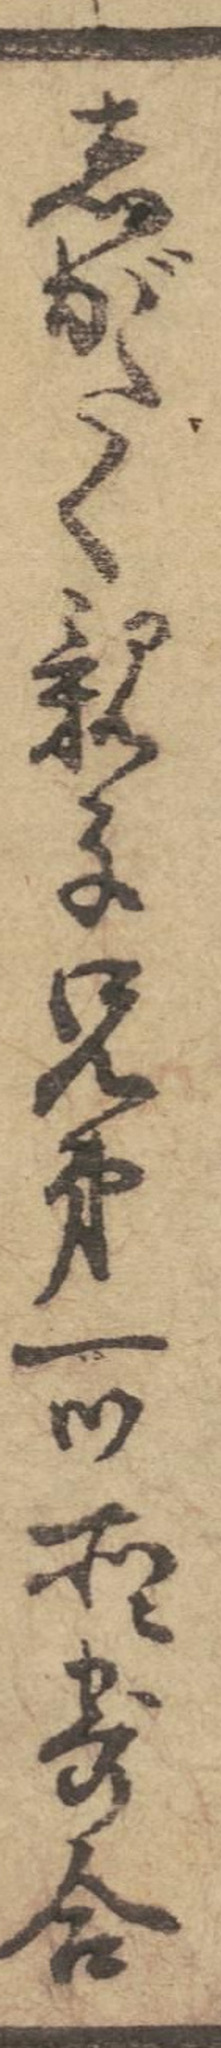しがたく親子兄弟一ッ所寄合
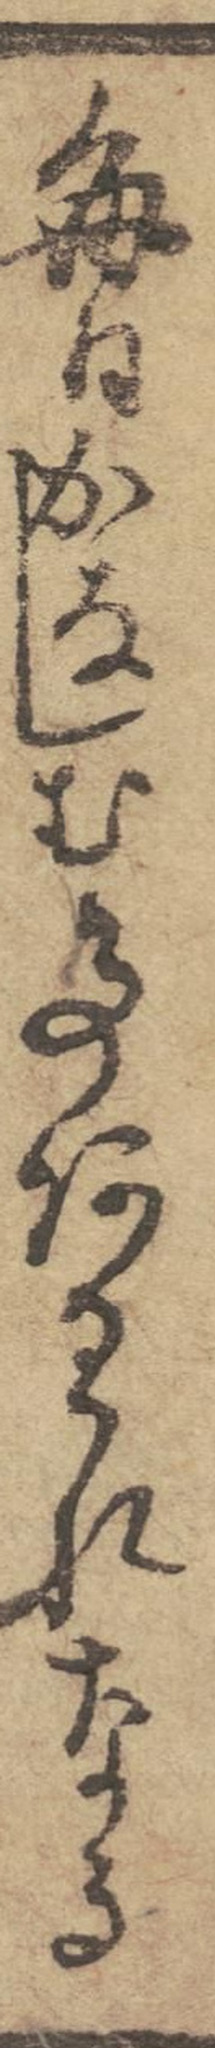毎日悲しむ事あわれなる
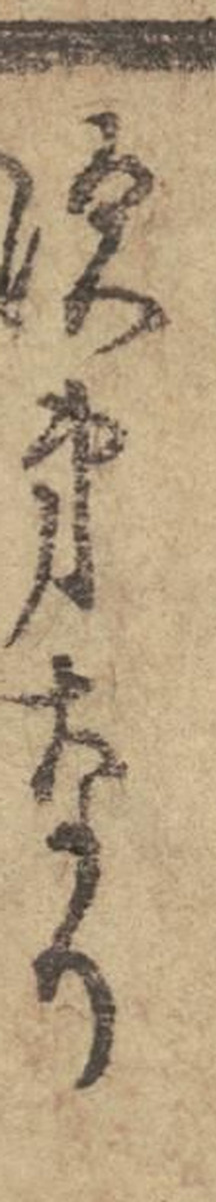次第なり
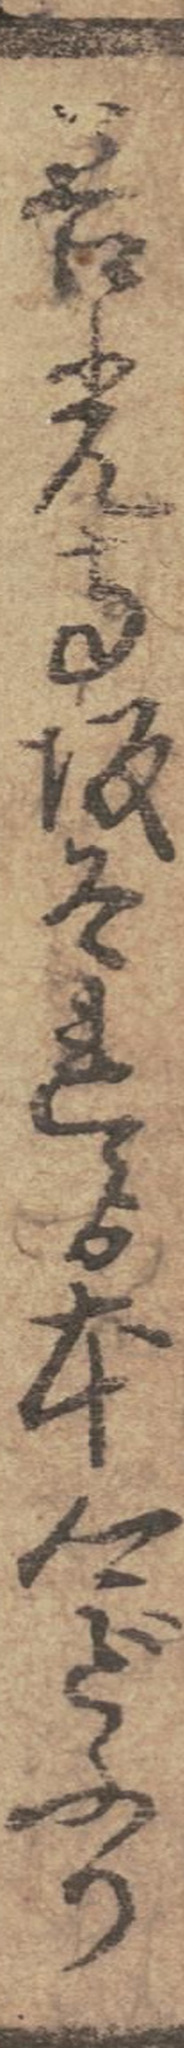善光寺坂それより本郷どふり
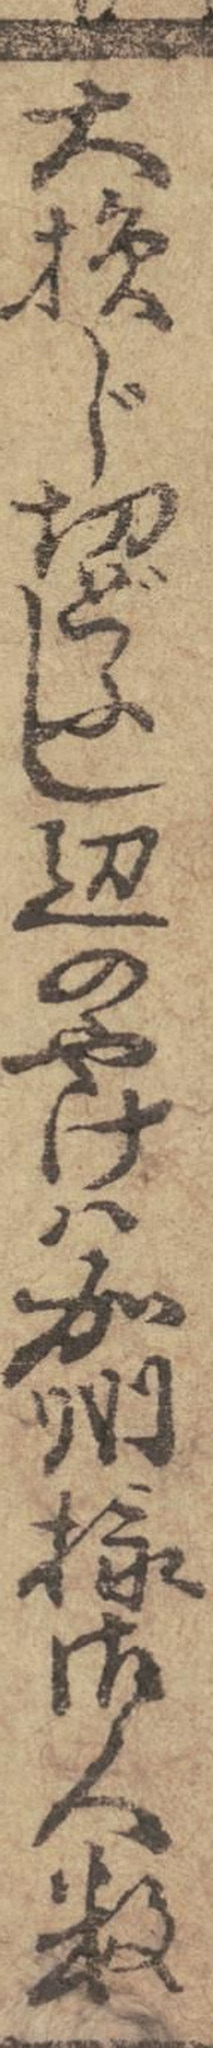大損じ切どふし辺のやけハ加州様御人数
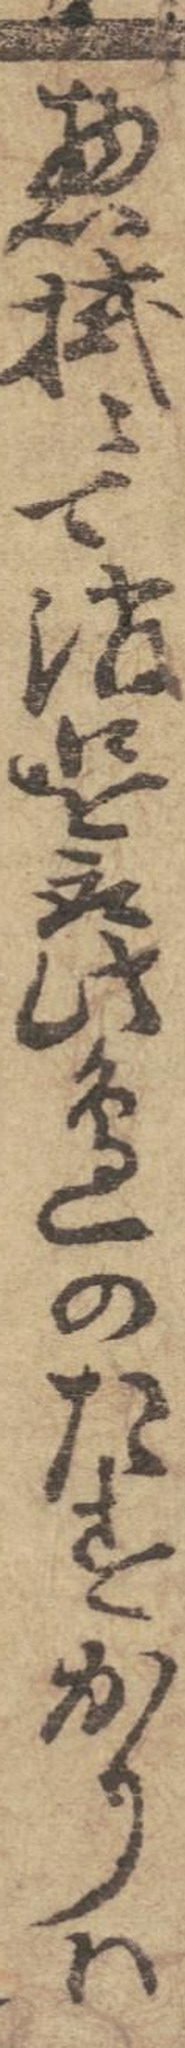惣掛二て消口を取此辺のたすかりハ
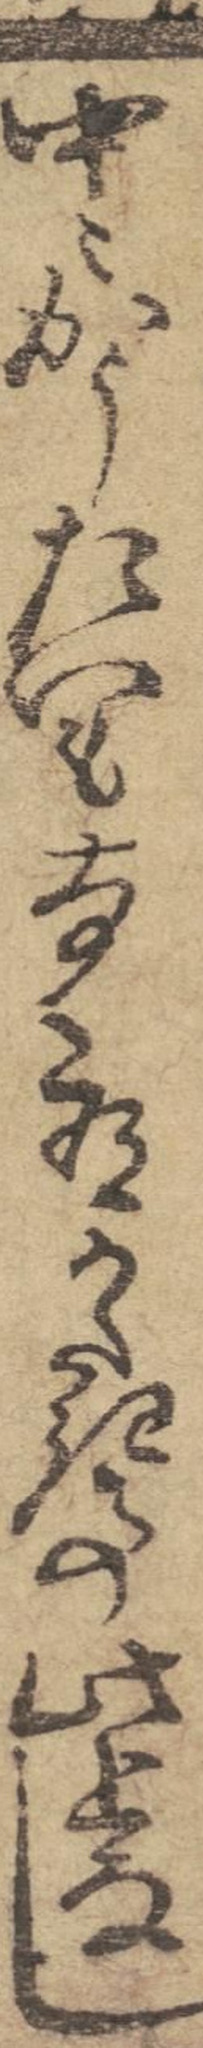中々かうたいもなりかたき事此上なし
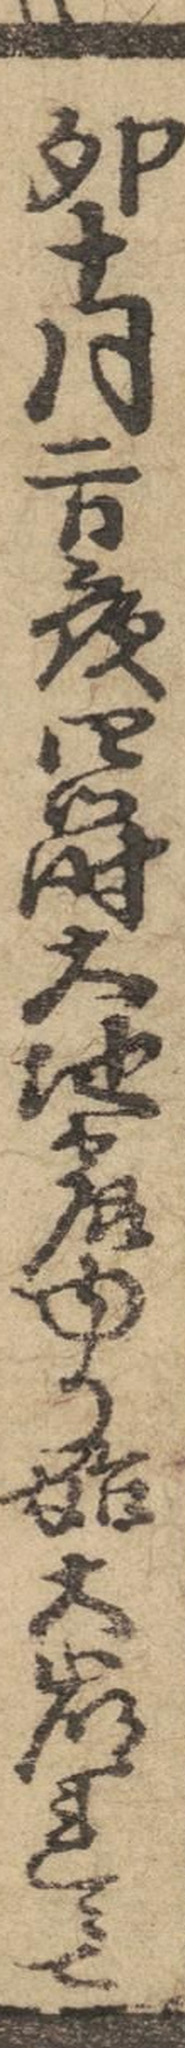卯十月二日夜四ッ時大地震ゆり始大崩れ二て
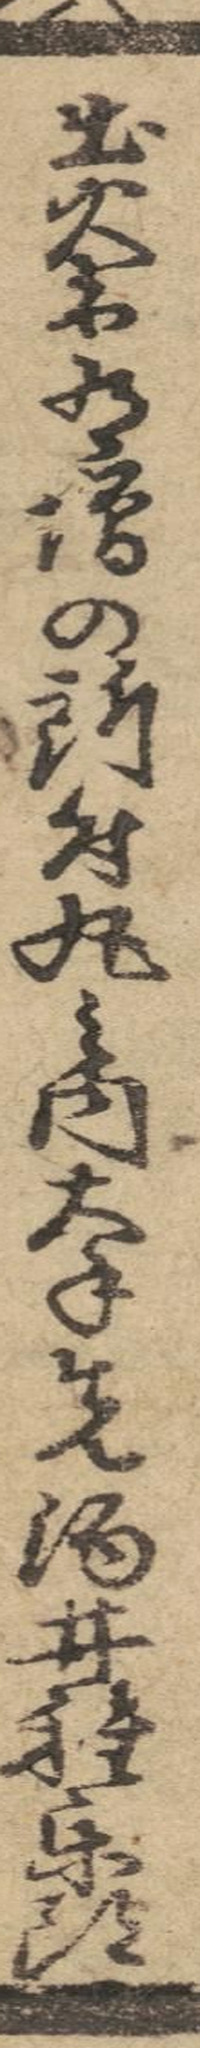出火等有増の所付丸之内大手先酒井雅楽頭
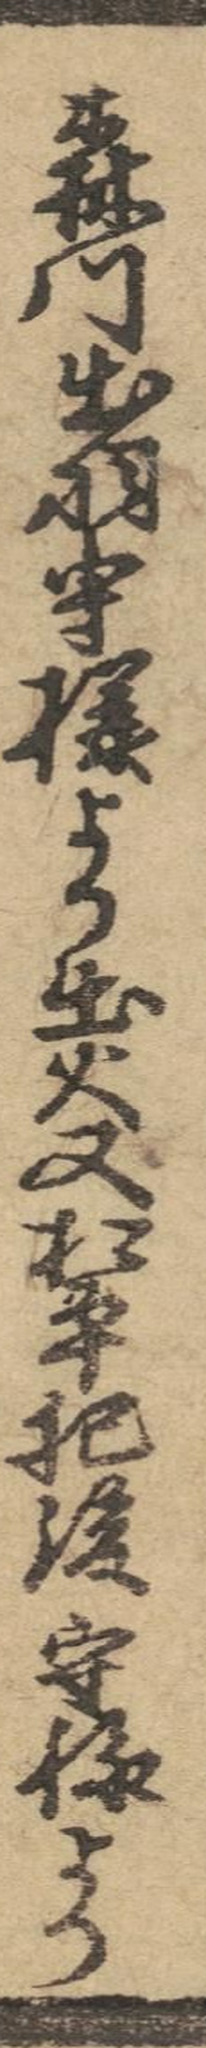森川出羽守様より出火又松平肥後守様より
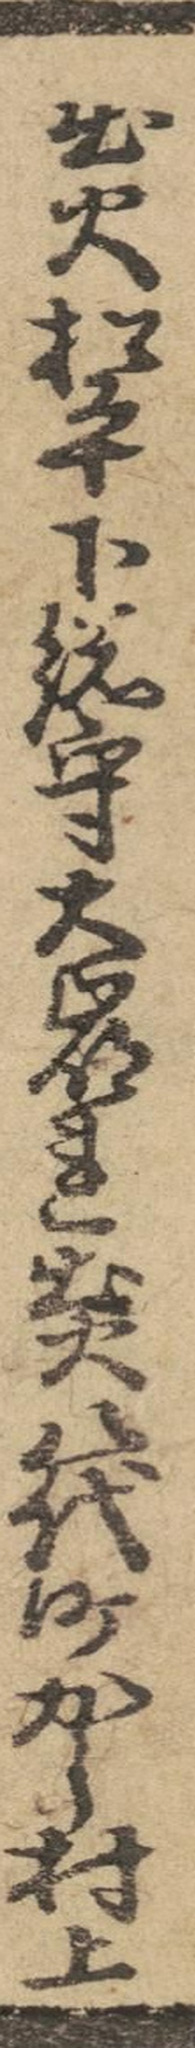出火松平下総守大崩れ出火八代町かし村上
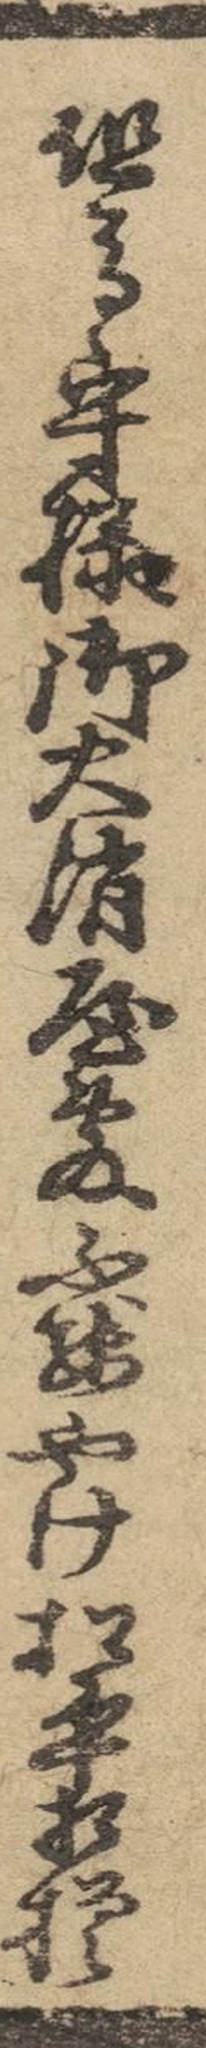但馬守様御火消屋敷不残やけ間同断平相模
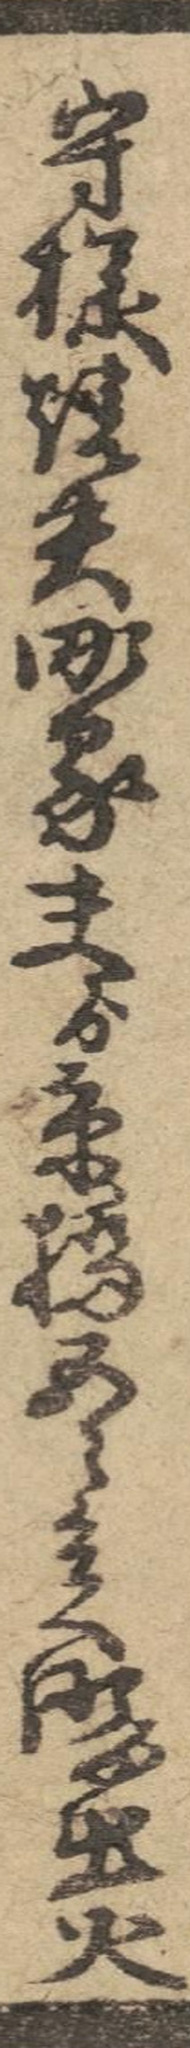守様焼失町家夫ゟ京橋五郎兵へ町ゟ出火
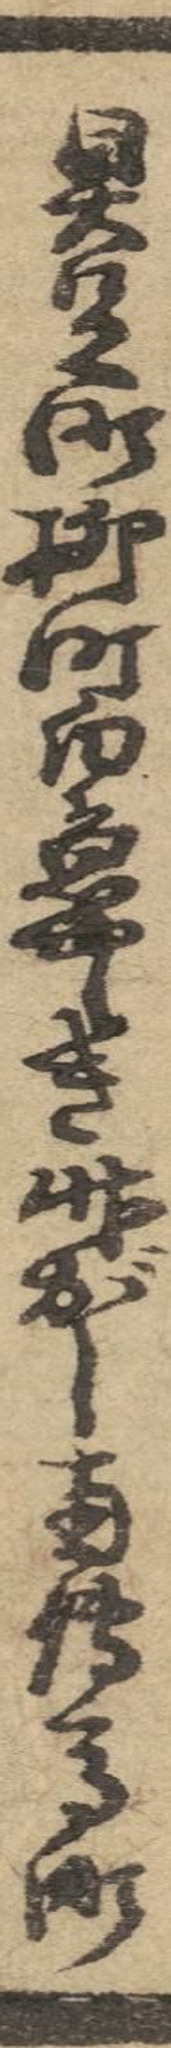具足町柳町白魚やしき竹がし南伝馬町
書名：安政二乙卯歳十月二日夜ル四ツ時震始メ末代
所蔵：東京大学地震研究所図書室 Earthquake Research Institute Library, The University of Tokyo, JAPAN
